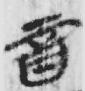音
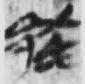○（蔡）
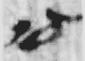公
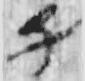子
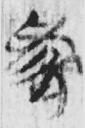○（家）
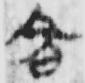各
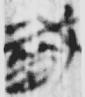戠
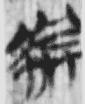豢
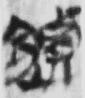饋
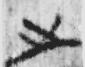之
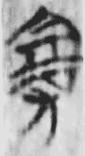賽
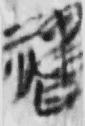禱
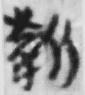新
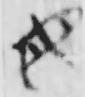母
